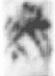綏
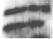二
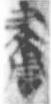畫
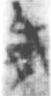○（伐）
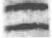二
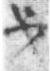戈
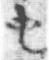屯
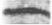一
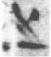之
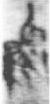顯（韅）
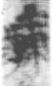鞅
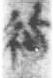紫
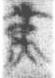黃
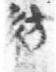紡
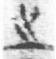之
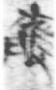雘
